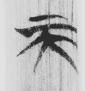天
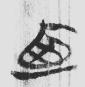廼
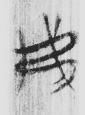弗
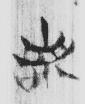若
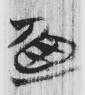廼
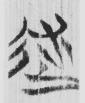述
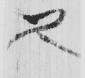氒
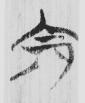命
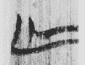亡
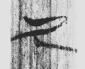氒
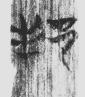邦
